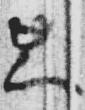也
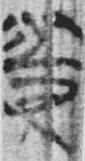貧
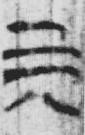而
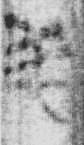民
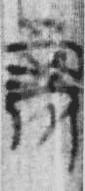聚
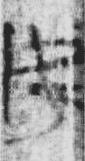𡚦（焉）
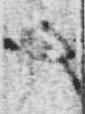又（有）
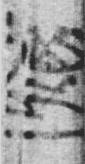道
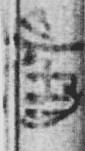者
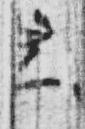也
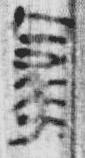蜀（獨）
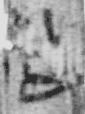居
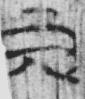而
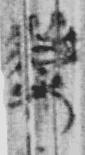樂
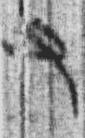又（有）
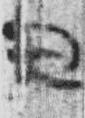內
